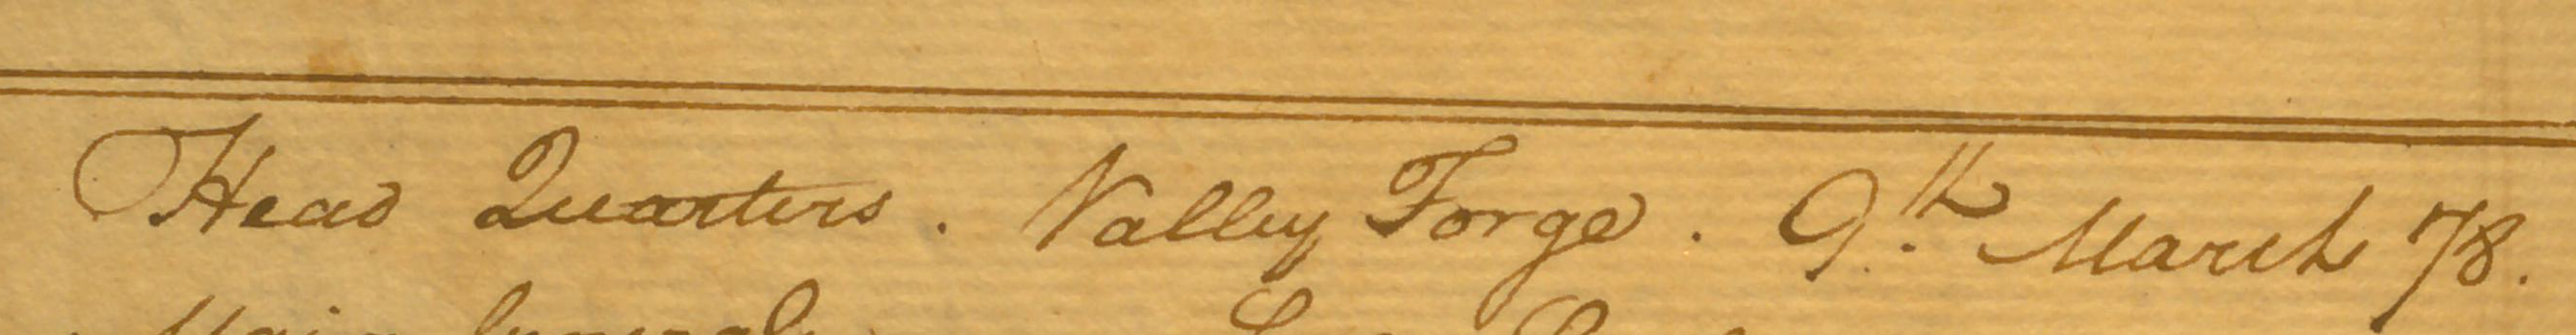Head Quarters. Valley Forge. 9^th. March 78.
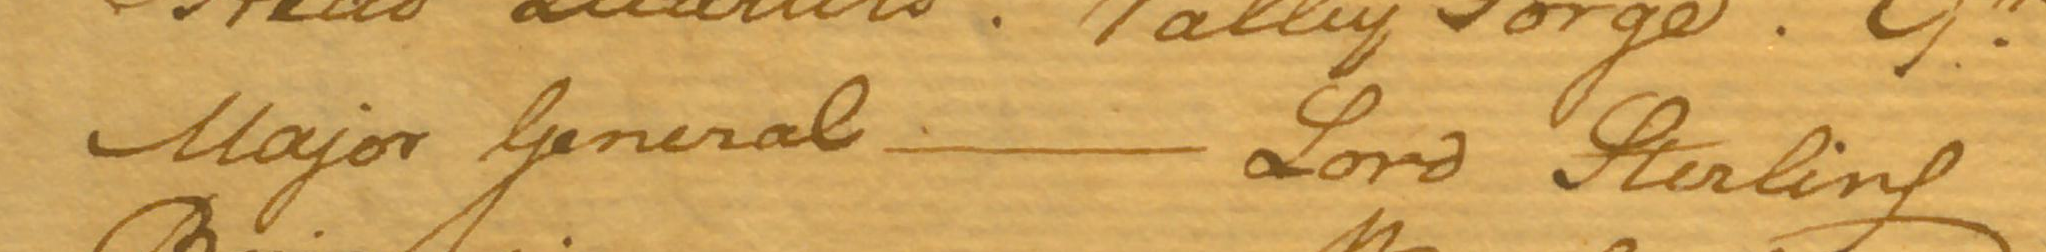Major General- Lord Sterling
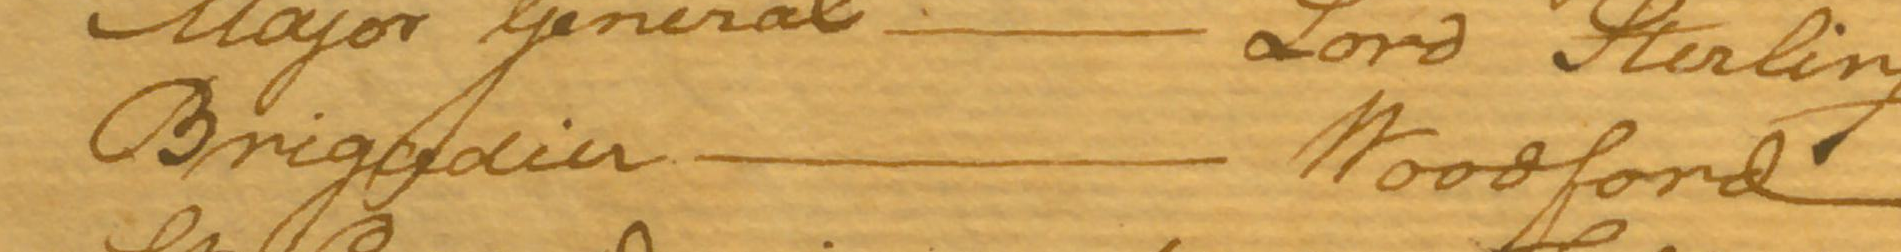Brigadier- Woodford
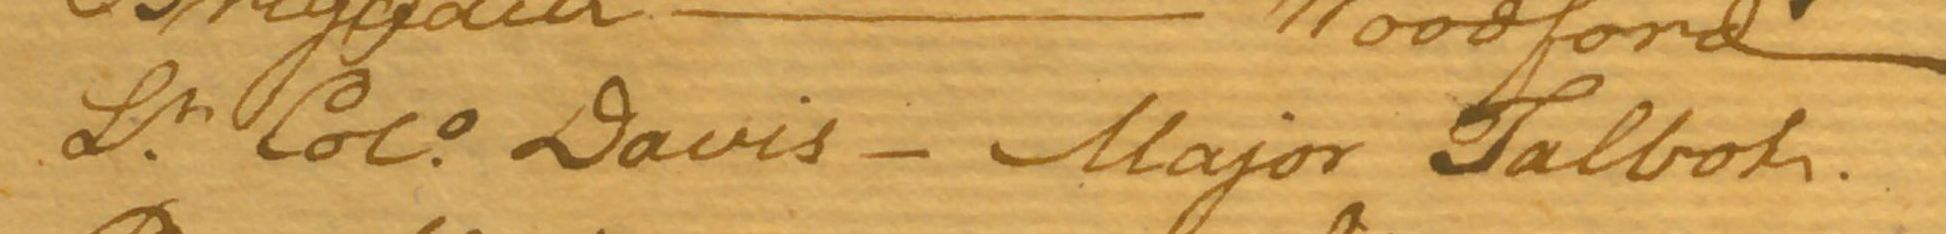L^t. Col^o. Davis- Major Talbot.
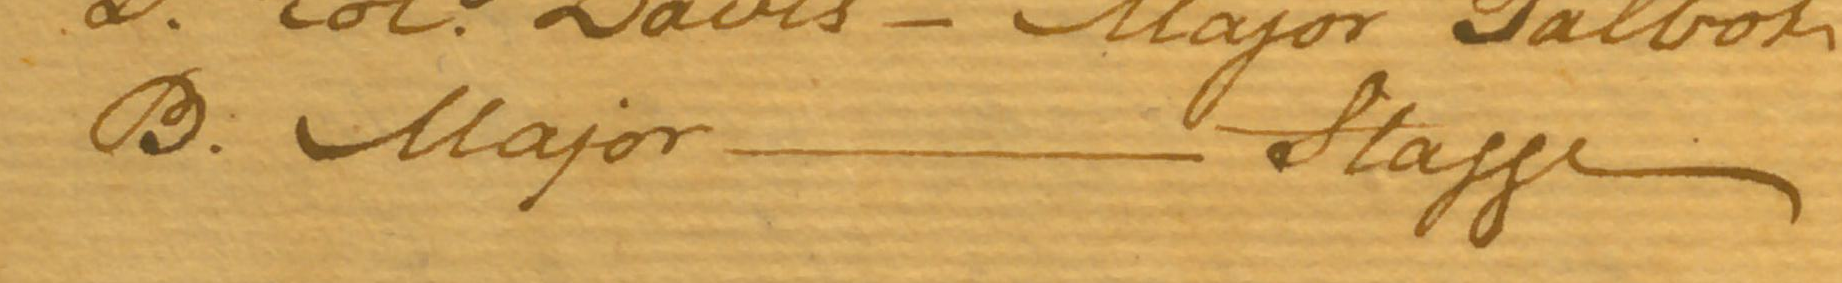B. Major- Stagg
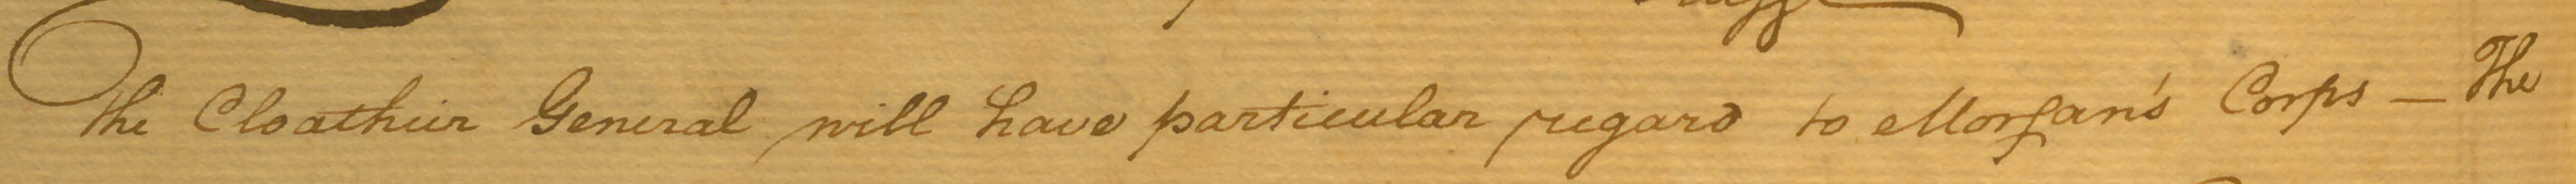The Cloathier General will have particular regard to Morgan's Corps- The
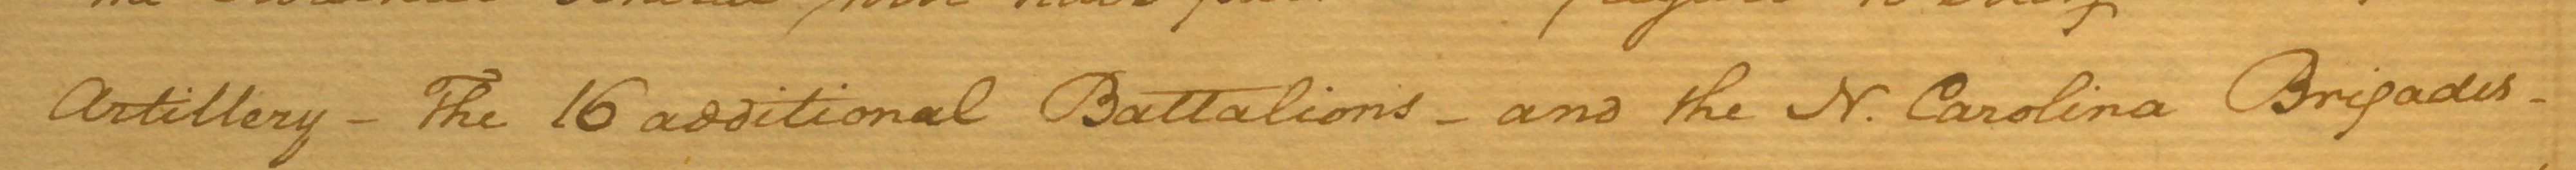Artillery- The 16 additional Battalions- and the N. Carolina Brigades.
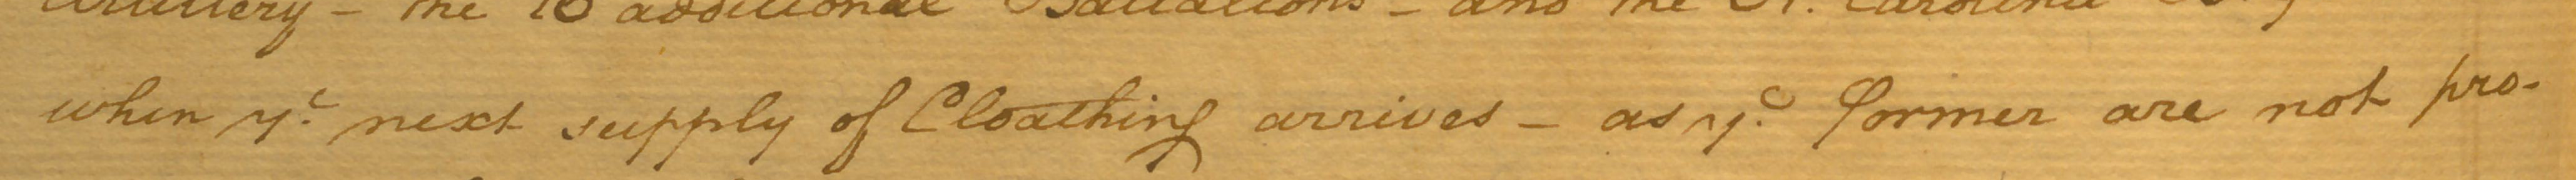when y^e. next supply of Cloathing arrives- and y^e. former are not pro-
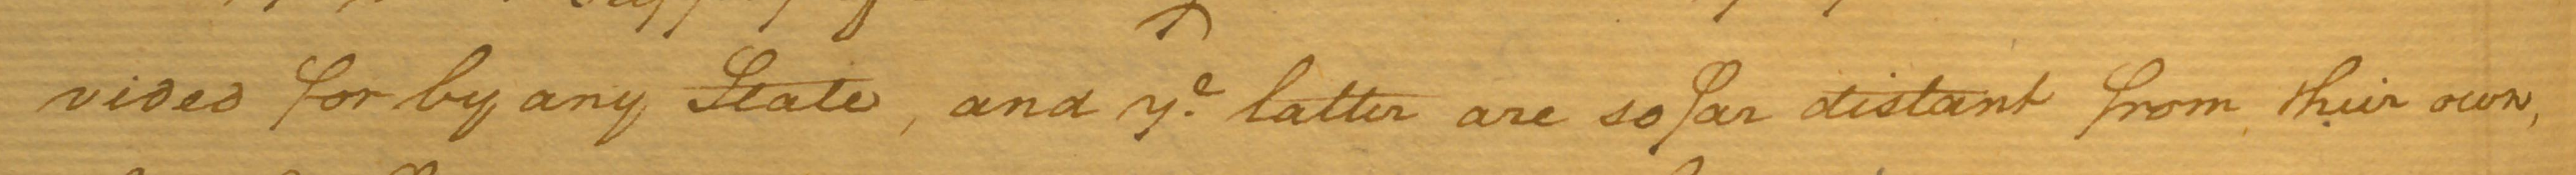vided for by any State, and y^e. latter are so far distant from their own,
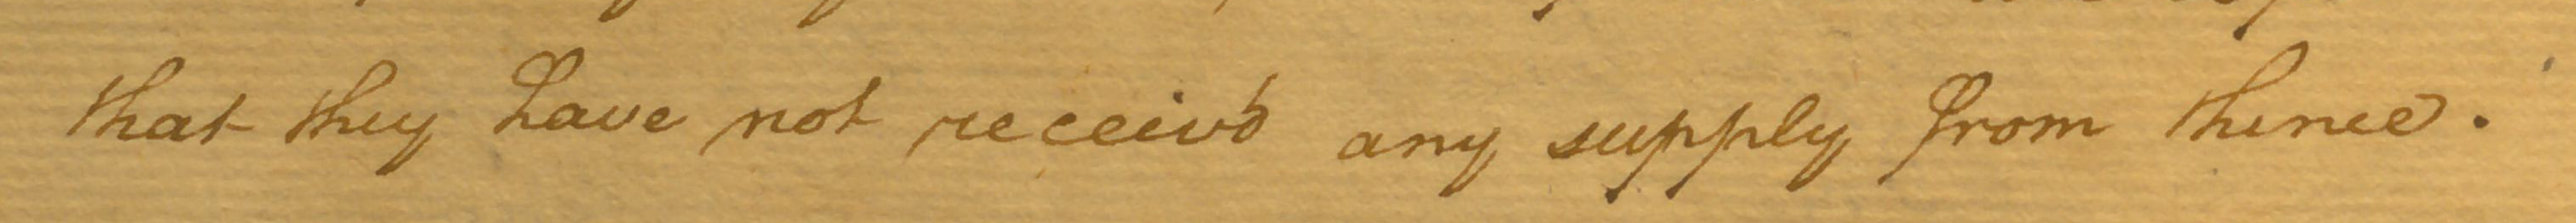that they have not receiv'd any supply from thence.
